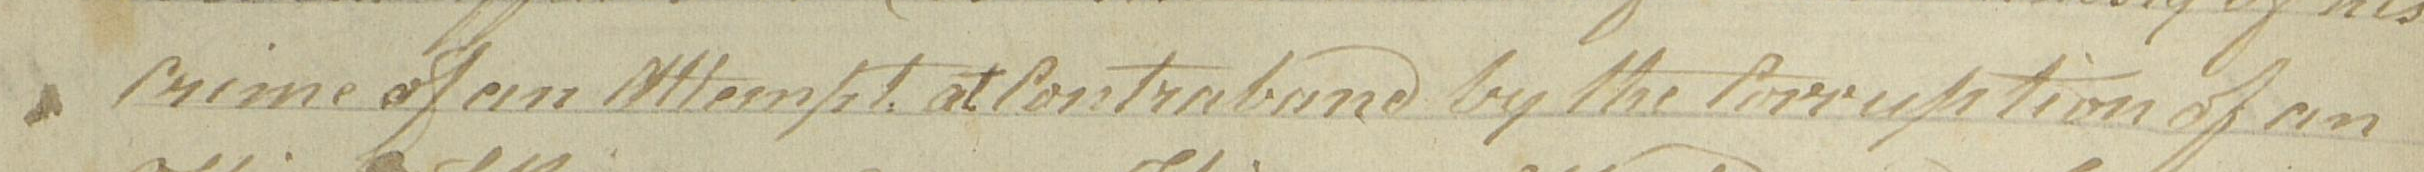Crime of an Attempt at Contraband by the Corruption of an
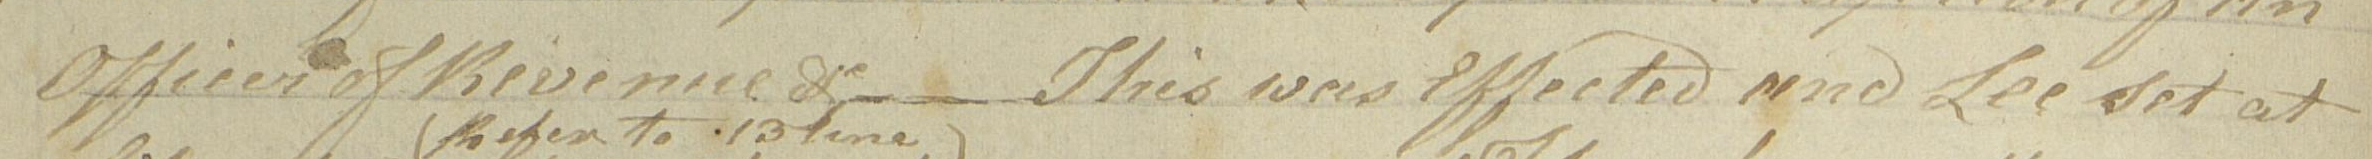Officer of Revenue &^c This was Effected and Lee set at
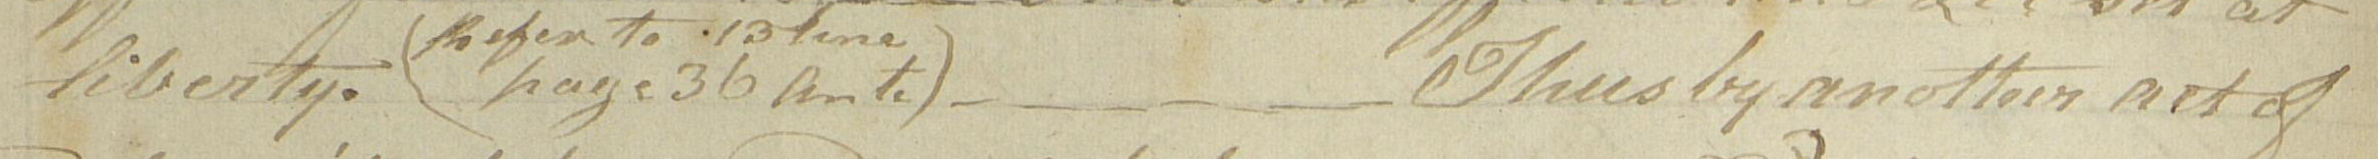liberty. (^ page 36 Ante) Thus by another act of
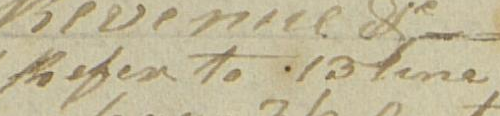Refer to 13 line
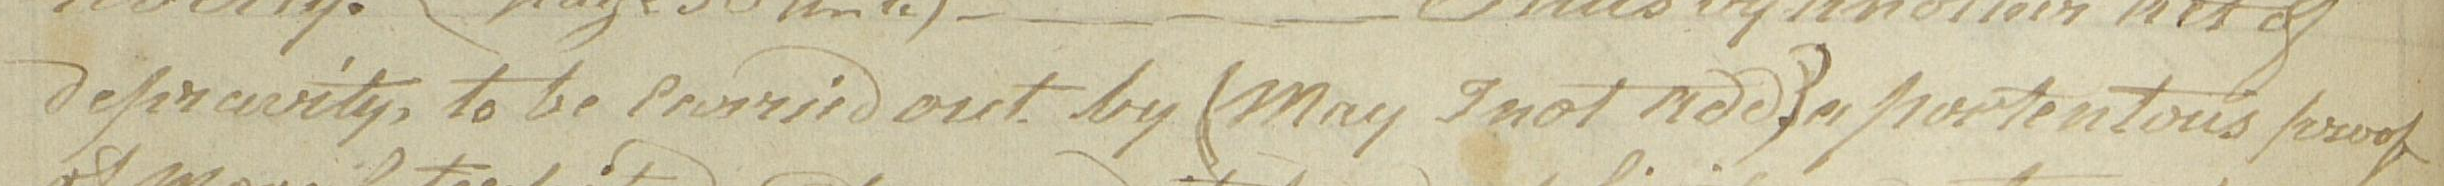depravity, to be carried out by (May I not add?) a portentous proof
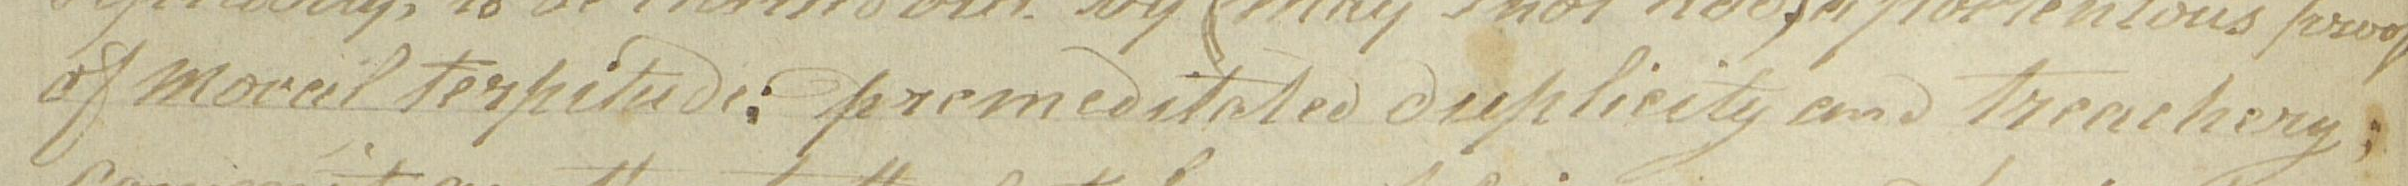of moral terpitude; premeditated duplicity and treachery;
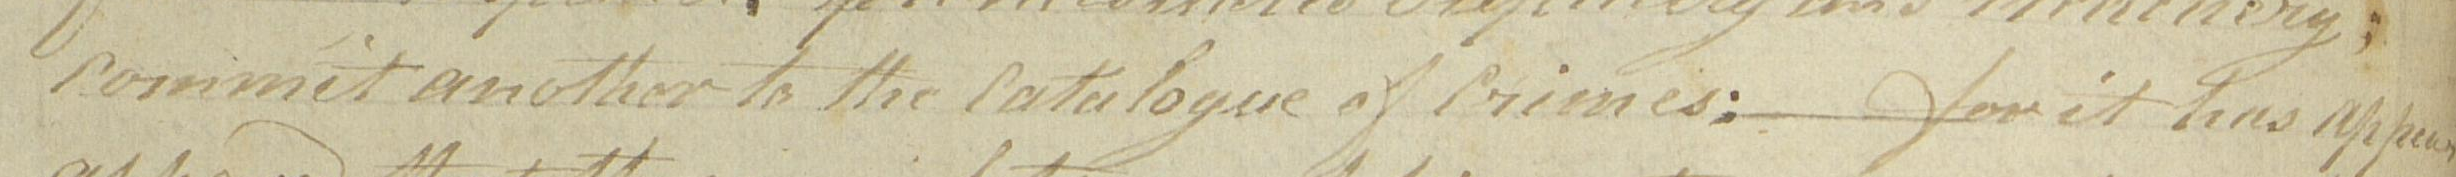commit another to the Catalogue of Crimes; for it has Appear-
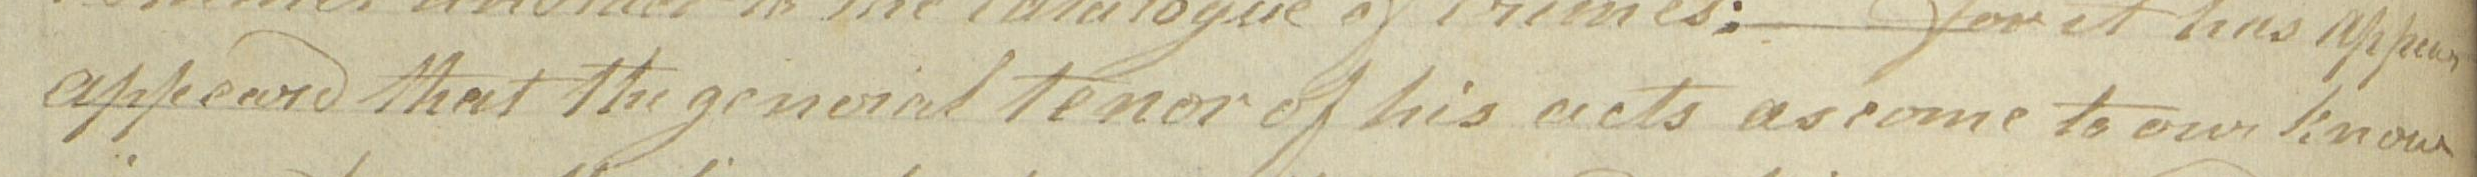appeared that the general tenor of his acts as come to our know-
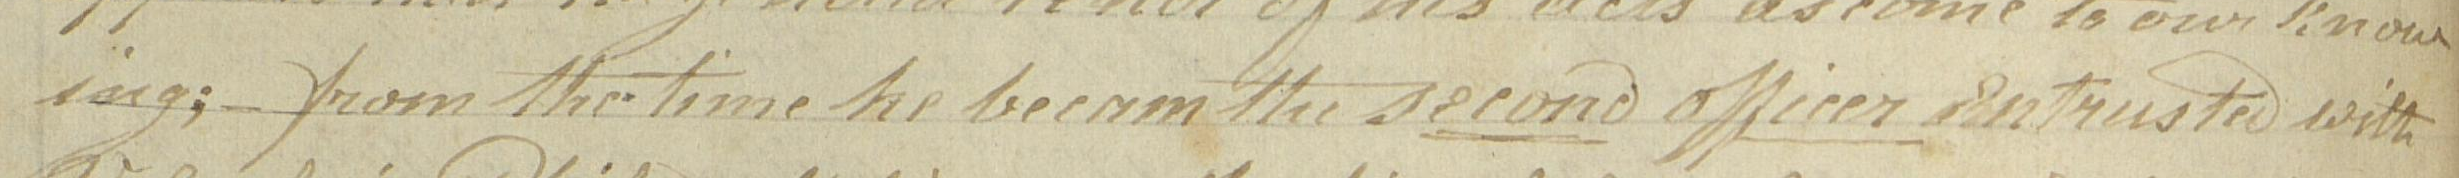-ing; from the time he becam the second officer entrusted with
